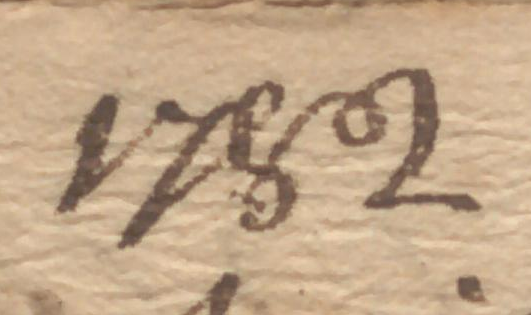1782
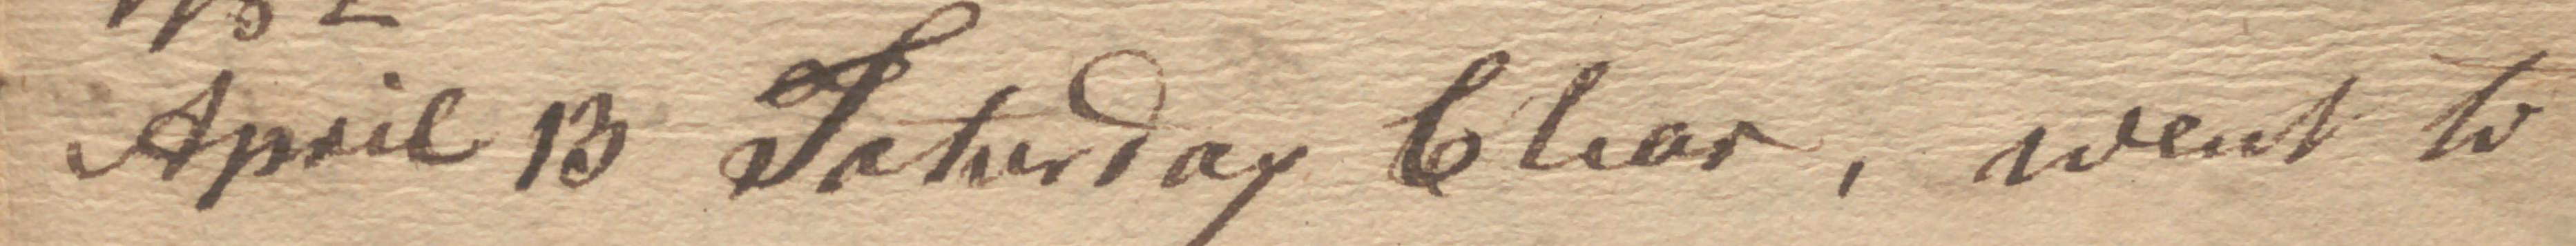April 13 Saturday Clear, went to
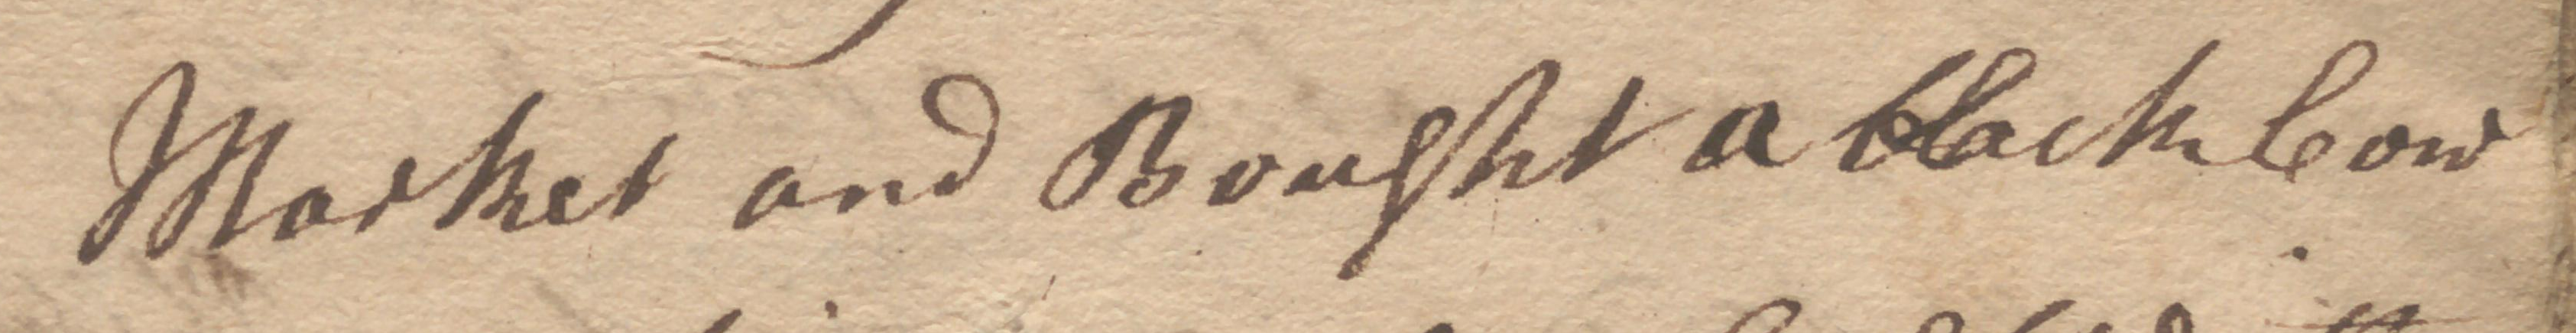Market and Bought a black Cow
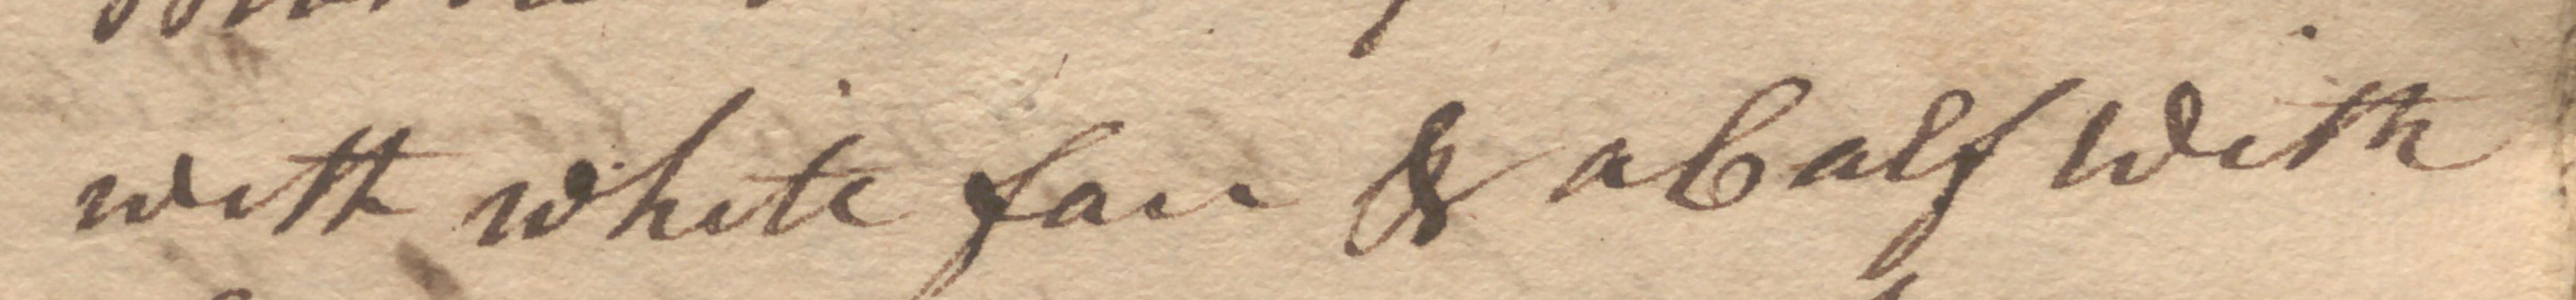with white fan & a Calf With
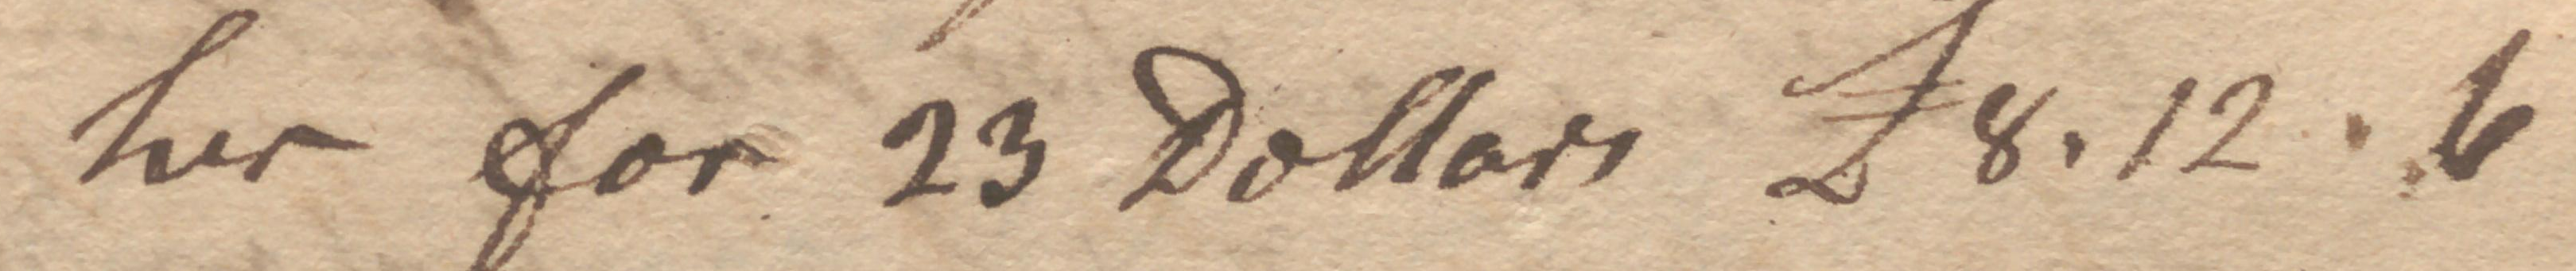her for 23 Dollars £8.12.6
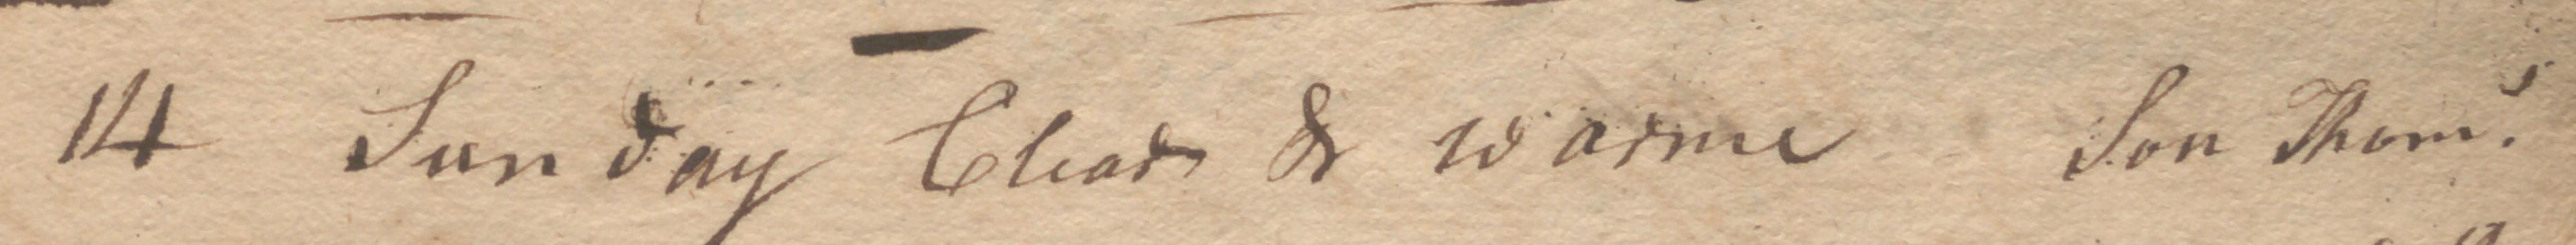14 Sunday Clear & warme Son Thom^s.
